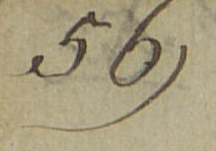56
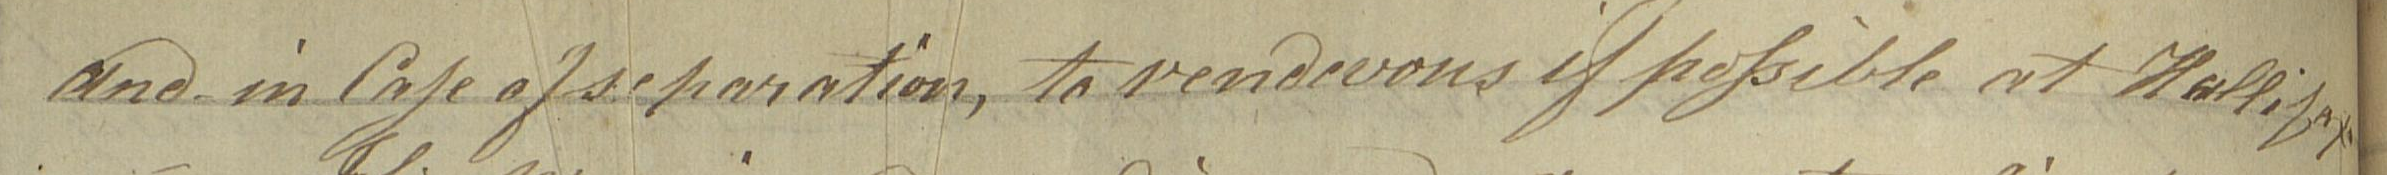and in Case of separation, to rendevous if possible at Hallifax
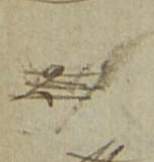24
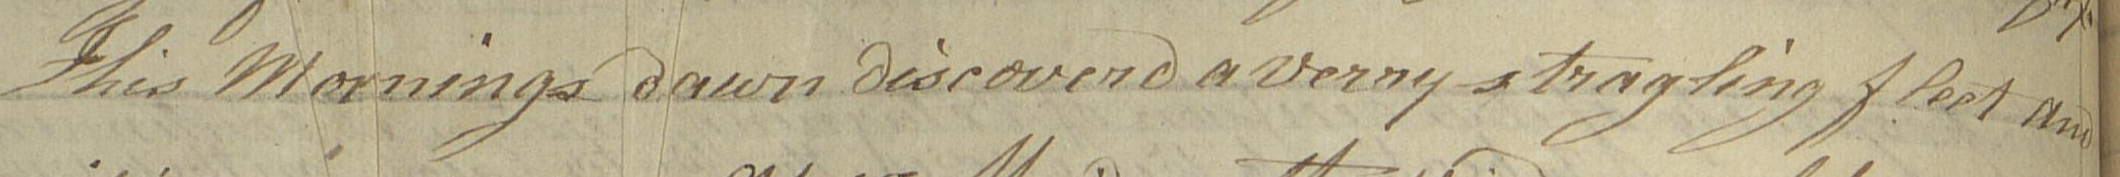This Mornings dawn discoverd a verry stragling fleet and
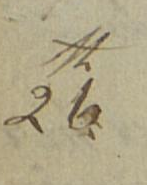26^th
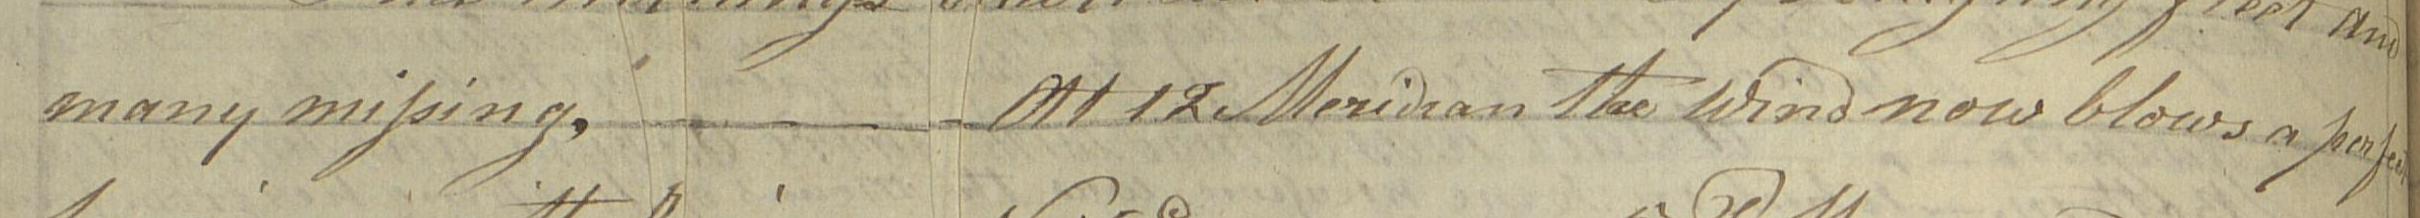many missing. All 12 Meridian the Wind now blows a pen-
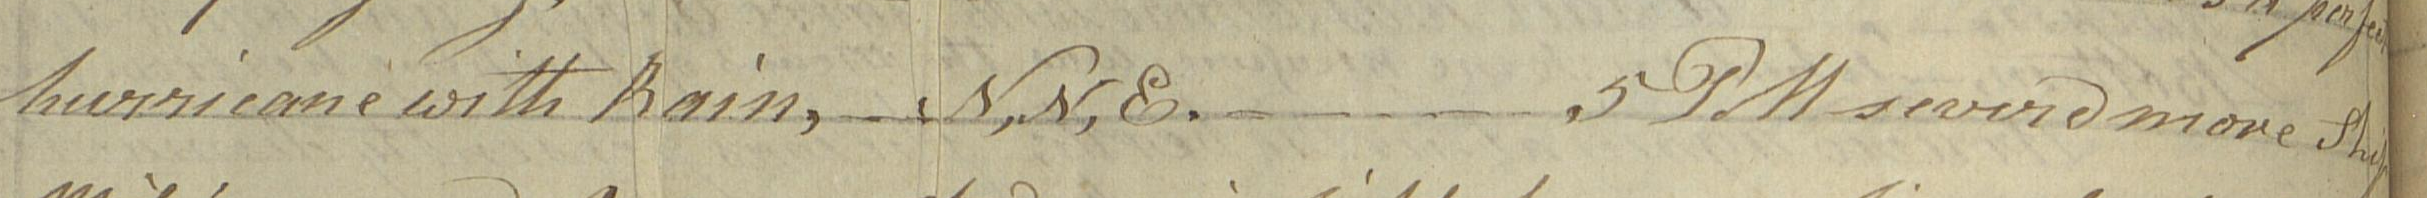hurricane with Bain, N.N.E. 5 PM severd more Shi-
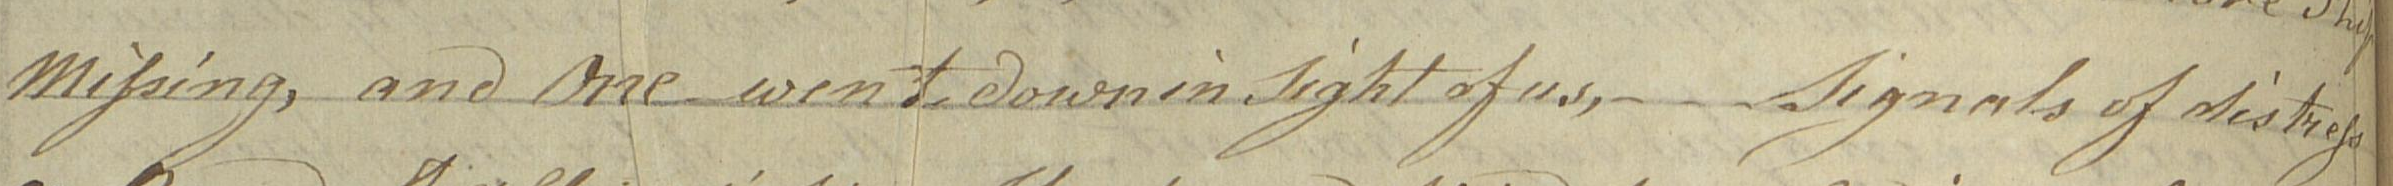missing, and one went down in Light of us, Signals of distress
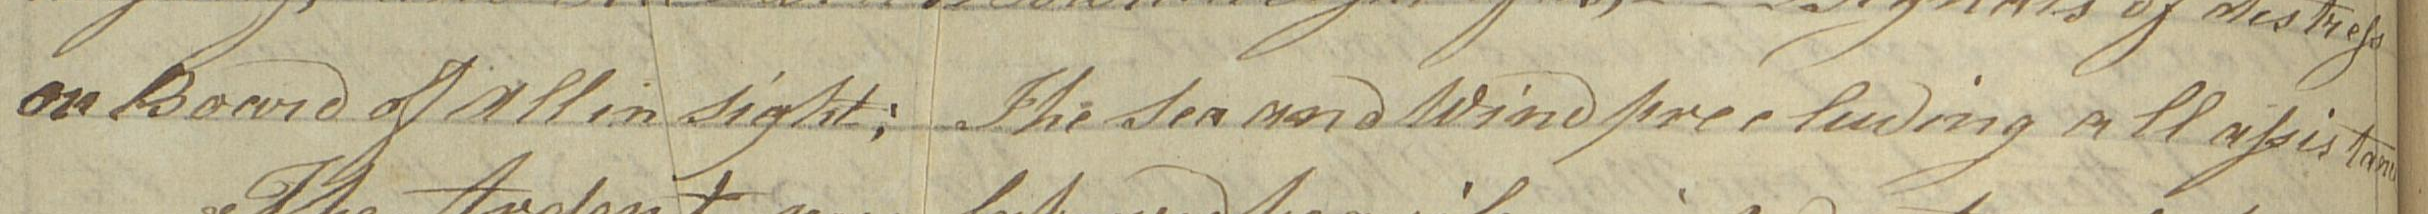on Board of All in sight; The Sea and Wind precluding all assistance
